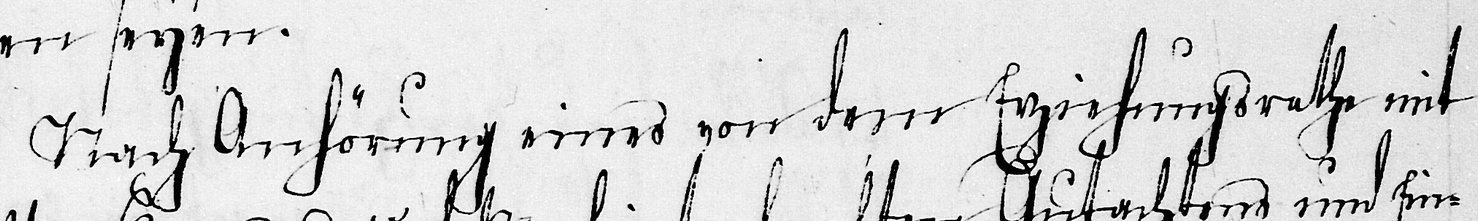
Nach Anhörung eines von dem Erziehungsrathe mit
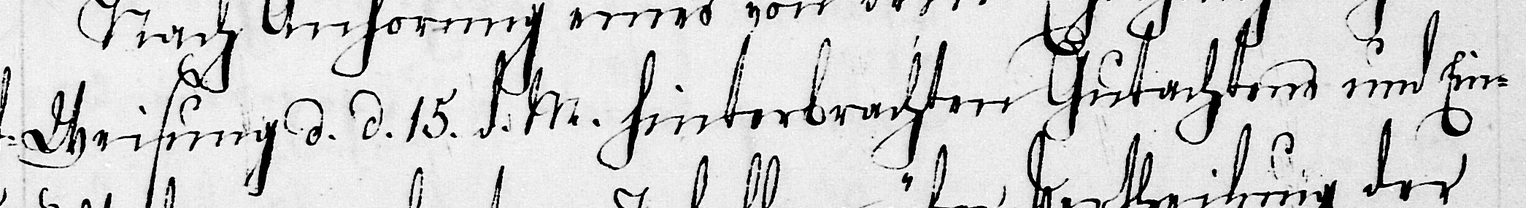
Weisung d. d. 15. d. M. hinterbrachten Gutachtens und Ein¬
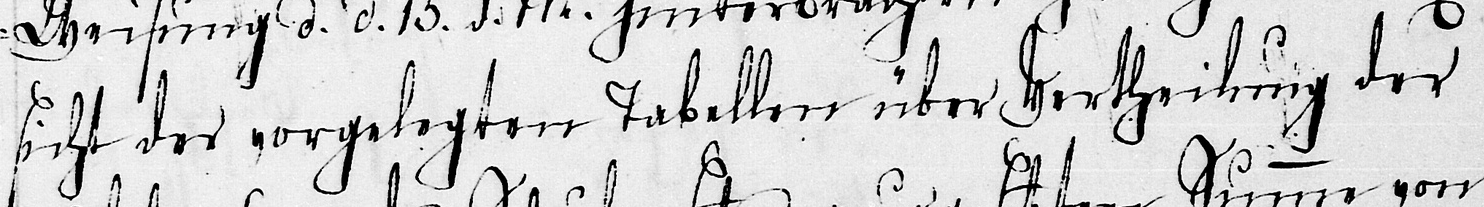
sicht der vorgelegten Tabellen über Vertheilung der
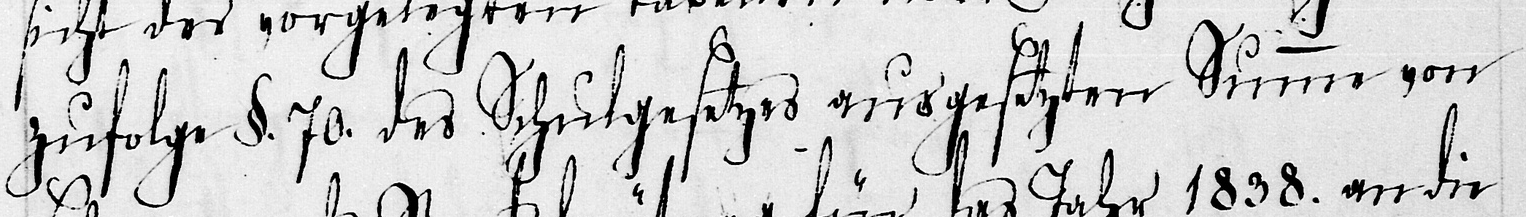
zufolge §. 70. des Schulgesetzes ausgesetzten Summe von
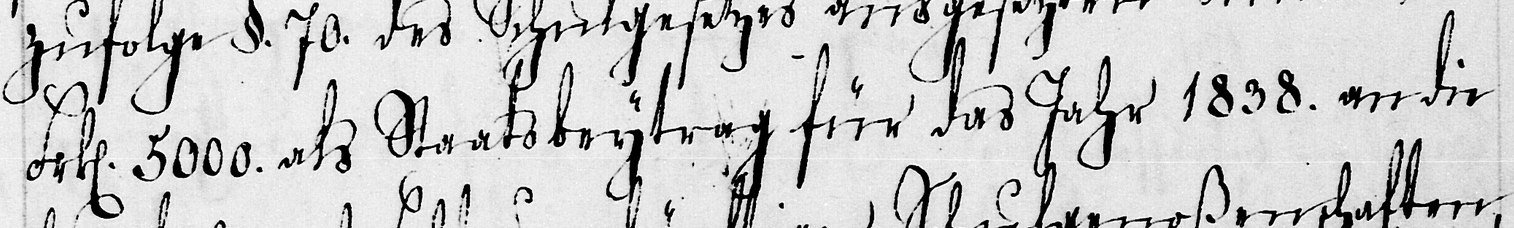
k[en]. 5000. als Staatsbeytrag für das Jahr 1838. an die
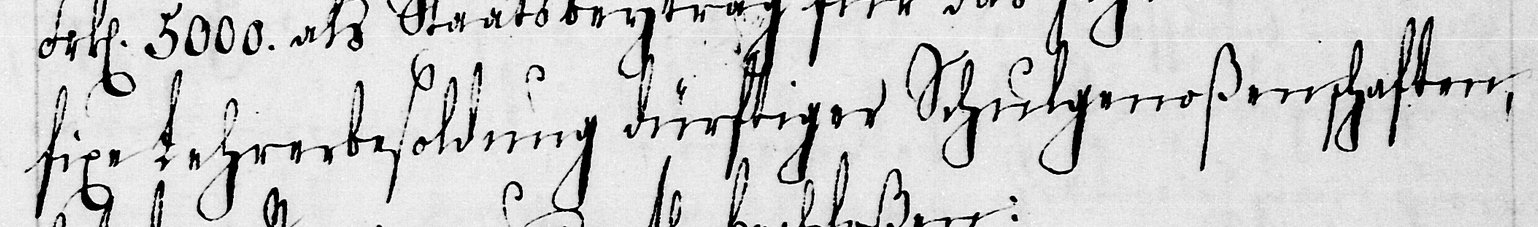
fixe Lehrerbesoldung dürftiger Schulgenoßenschaften,
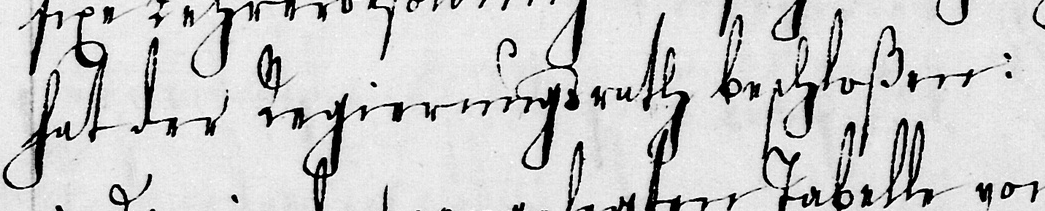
hat der Regierungsrath beschloßen:
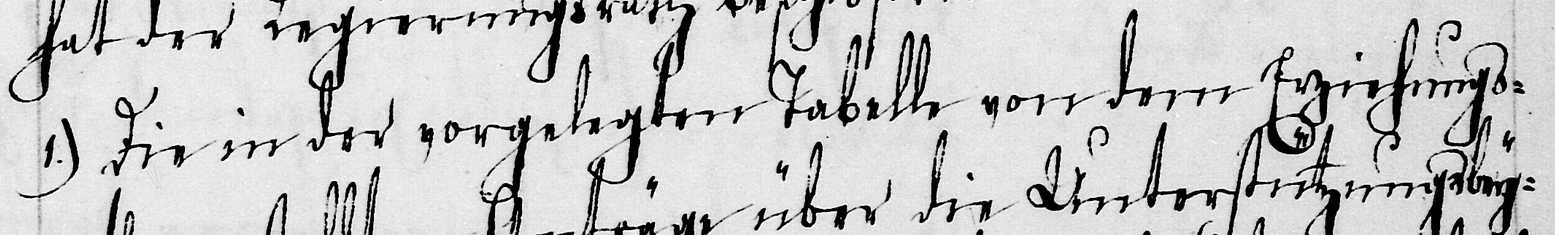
1.) Die in der vorgelegten Tabelle von dem Erziehungs¬
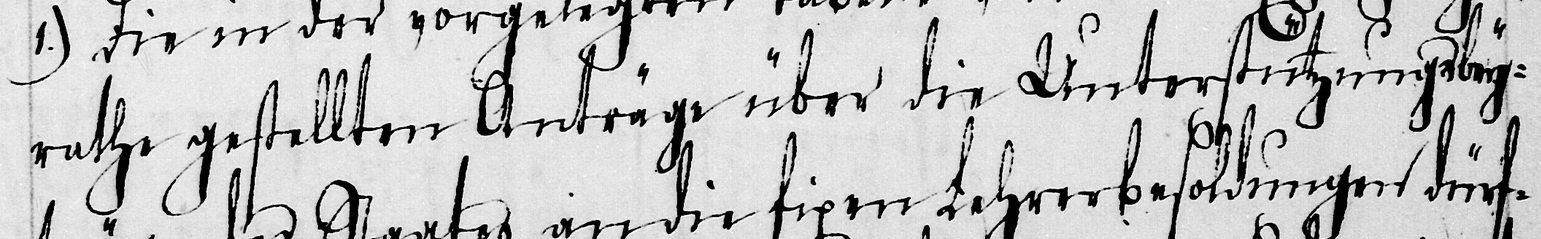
rathe gestellten Anträge über die Unterstützungsbey¬
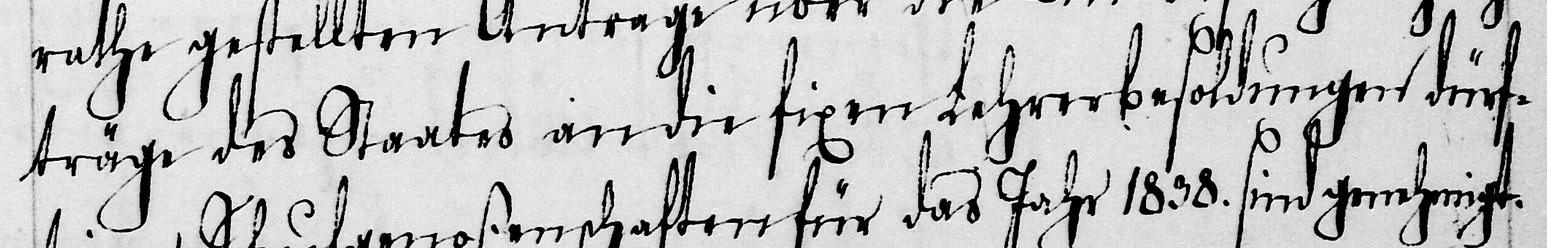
träge des Staates an die fixen Lehrerbesoldungen dürf¬
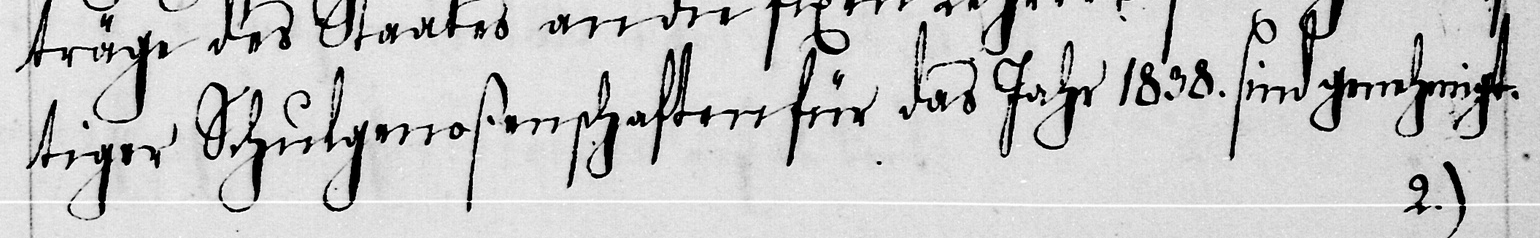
tiger Schulgenoßenschaften für das Jahr 1838. sind genehmig¬
